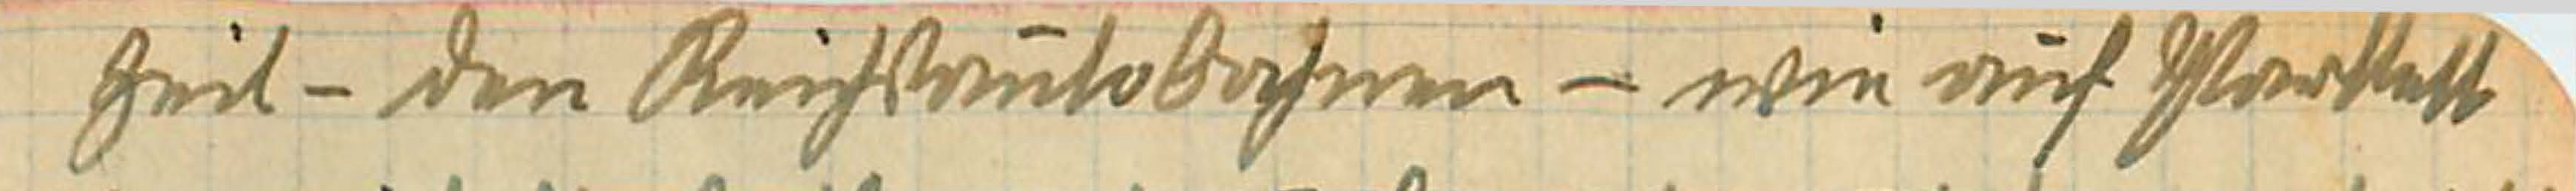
Zeit – den Reichsautobahnen – wie auf Parkett
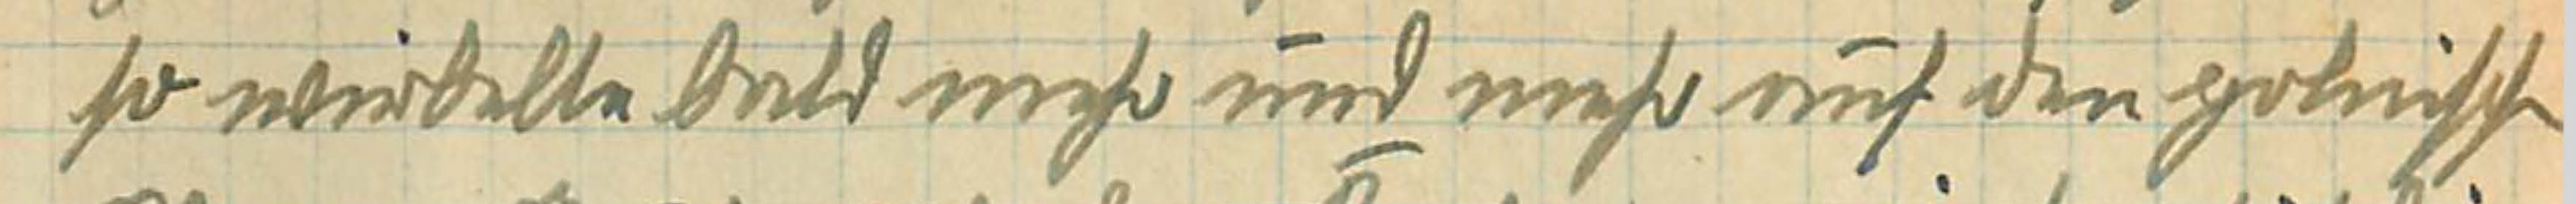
so wirbelte bald mehr und mehr auf den polnischen
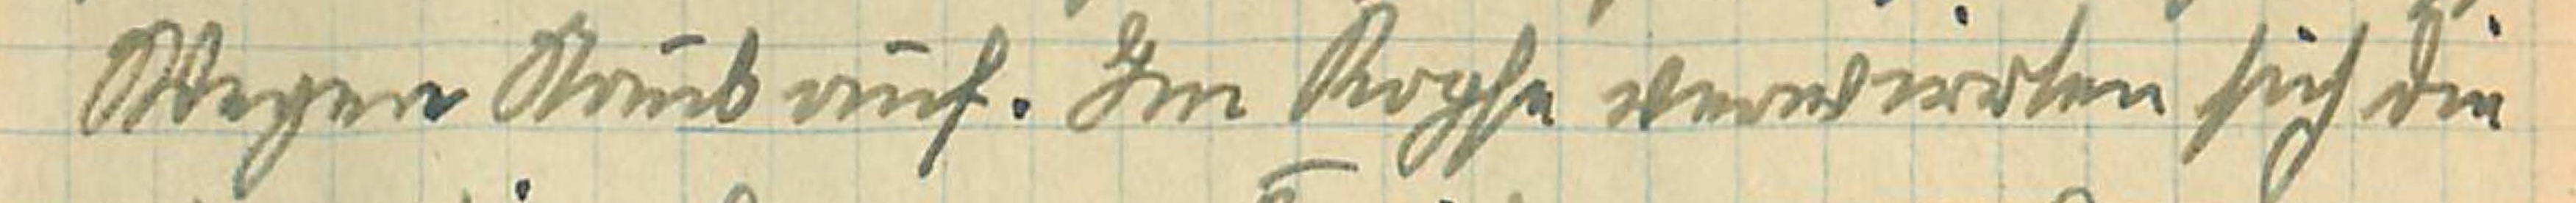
Wegen Staub auf. Im Kopfe verwirrten sich die
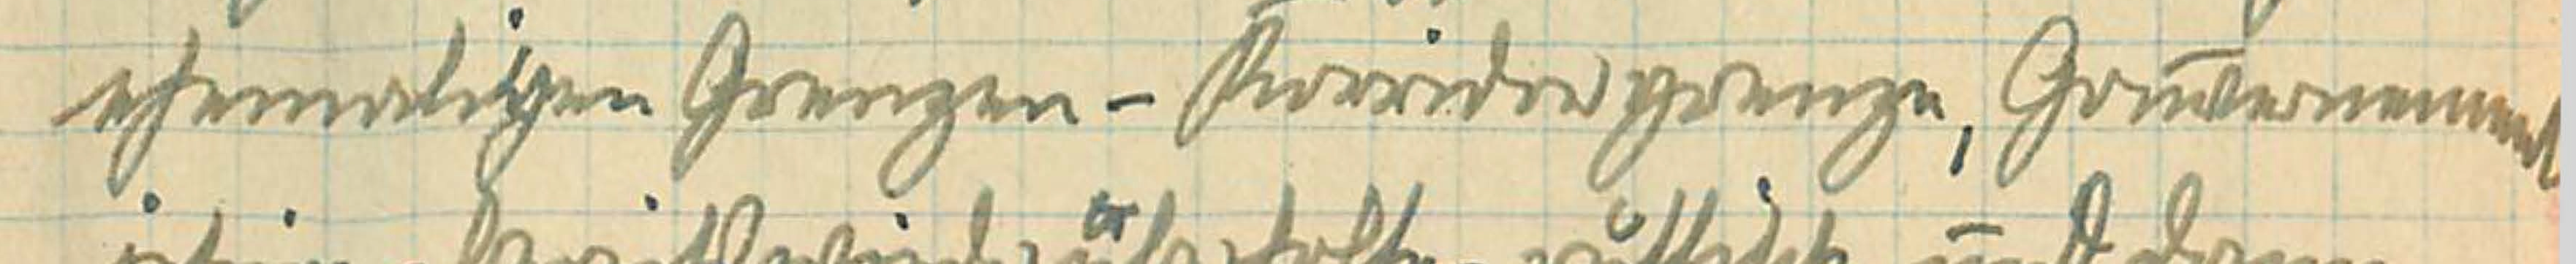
ehemaligen Grenzen – Korridorgrenze, Gouvernement
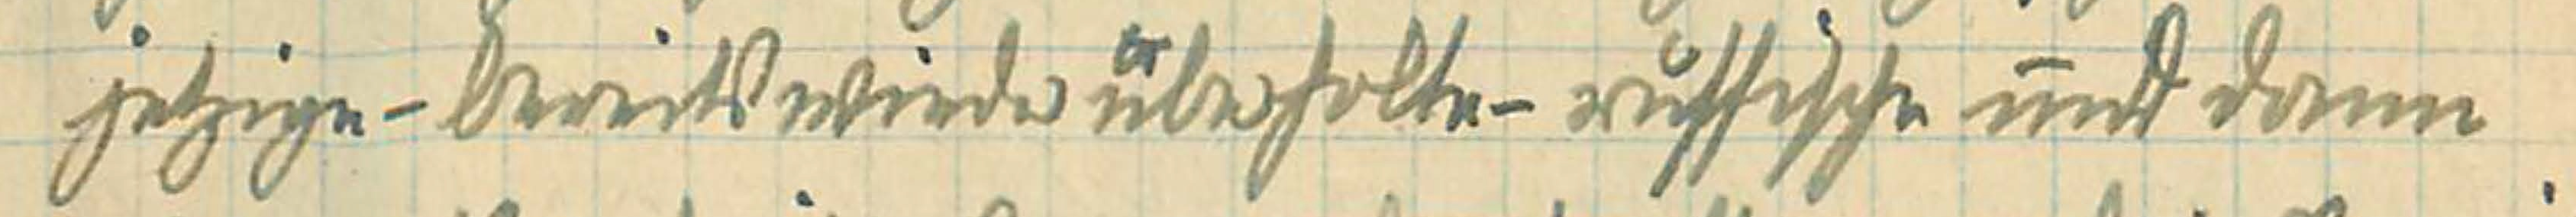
jetzige – bereits wieder überholte – russische und dann
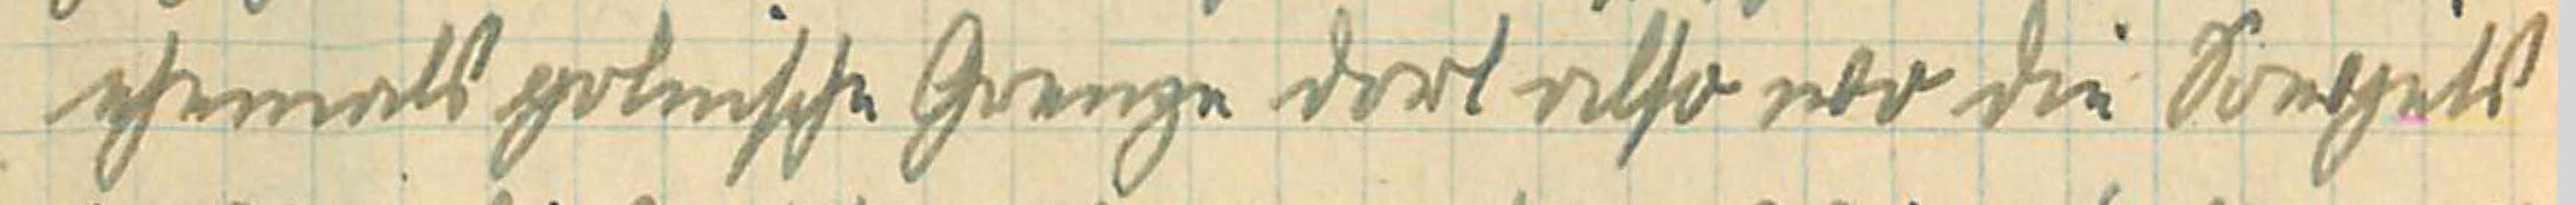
ehemals polnische Grenze dort also wo die Sowjets
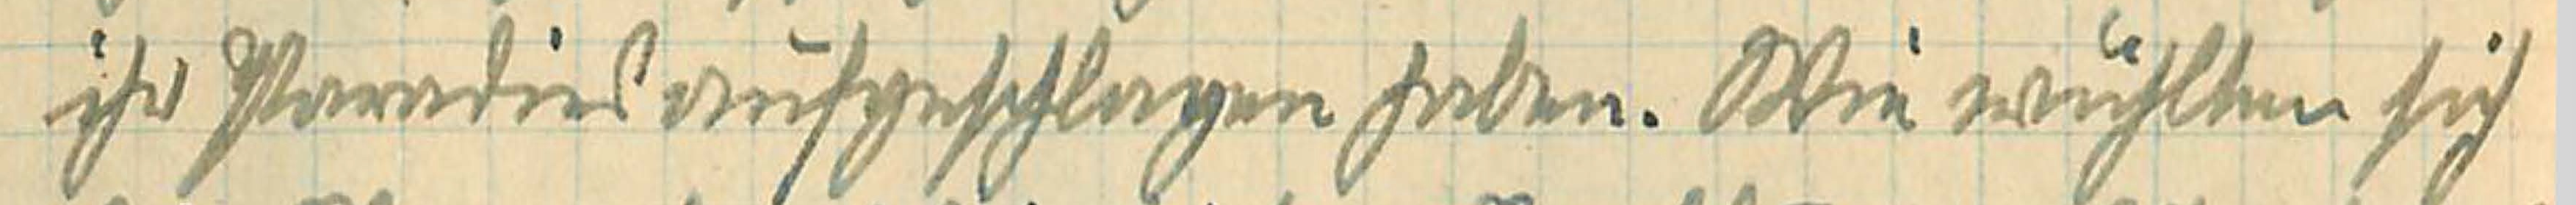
ihr Paradies aufgeschlagen haben. Wie wühlten sich
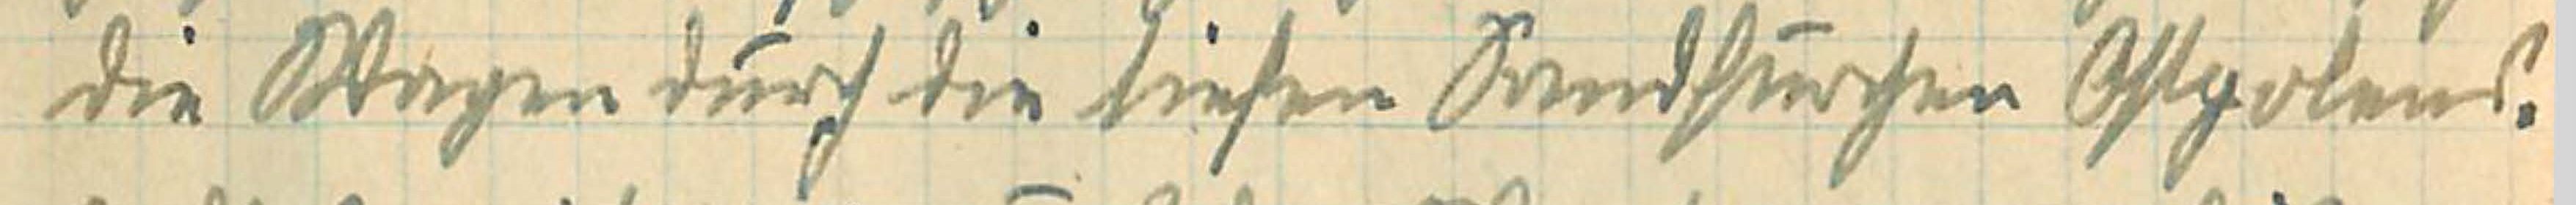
die Wagen durch die tiefen Sandfurchen Ostpolens.
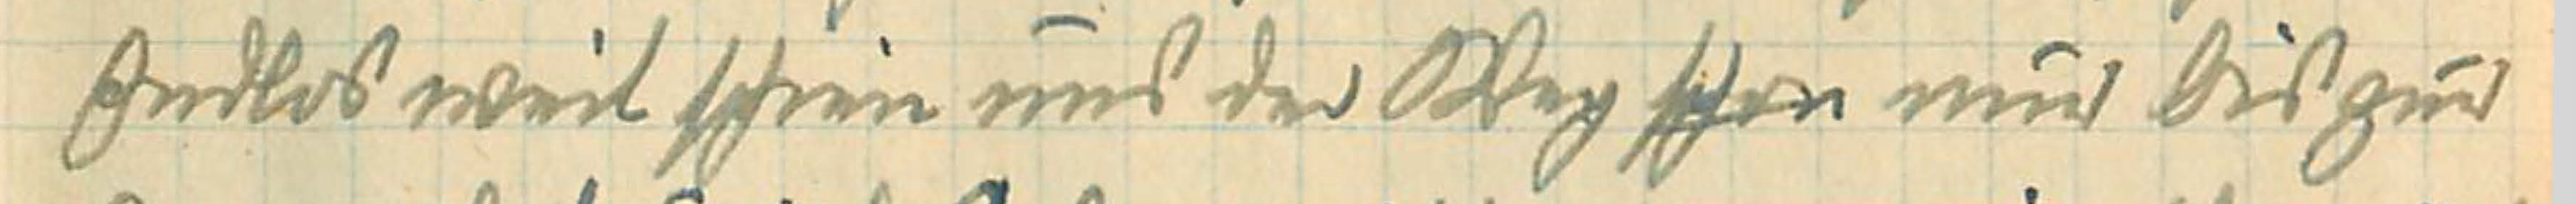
Endlos weit schien uns der Weg schon nur bis zur
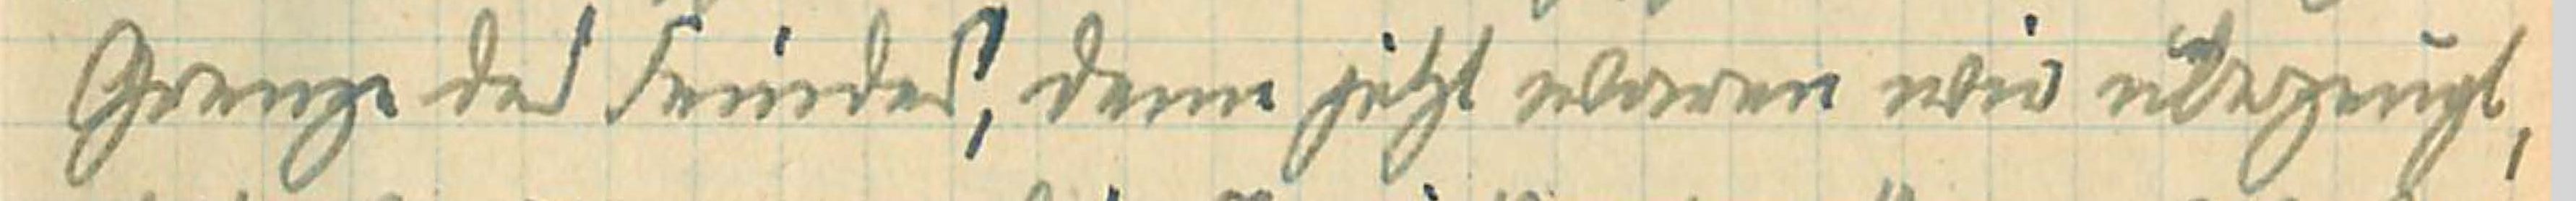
Grenze des Feindes, denn jetzt waren wir überzeugt,
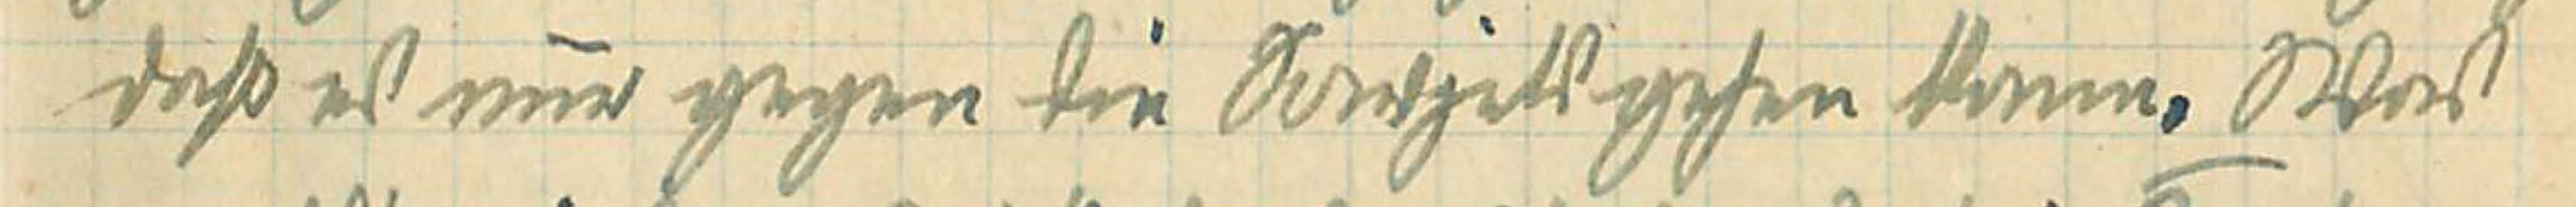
daß es nur gegen die Sowjets gehen kann. Was
